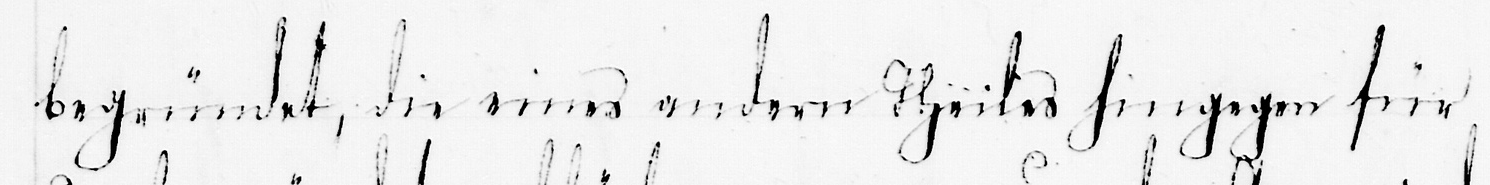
begründet, die eines andern Theiles hingegen für
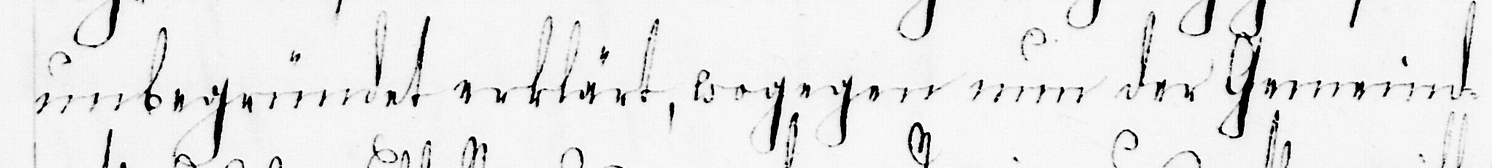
unbegründet erklärt, wogegen nun der Gemeind¬
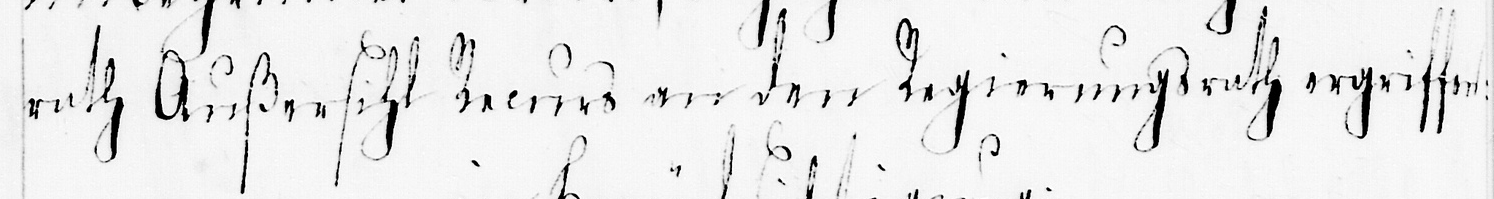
rath Außersihl Recurs an den Regierungsrath ergriff¬
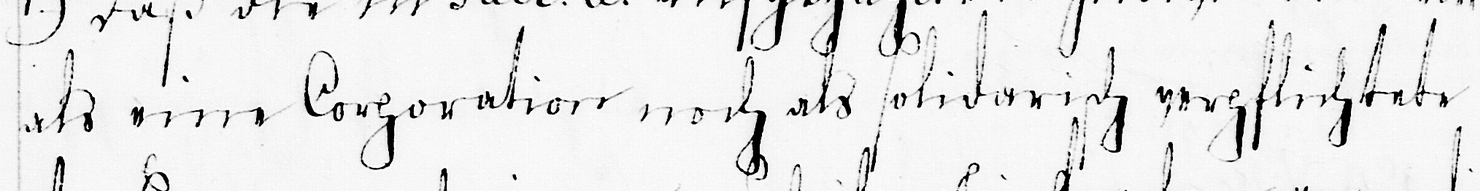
als eine Corporation noch als solidarisch verpflichtete
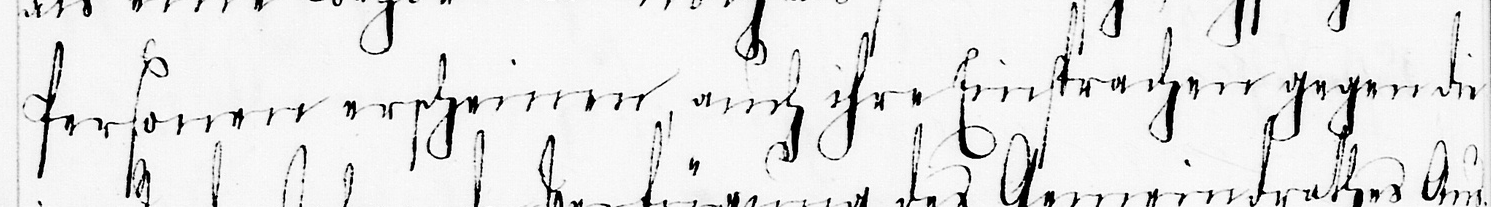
Personen erscheinen, auch ihre Einsprachen gegen die
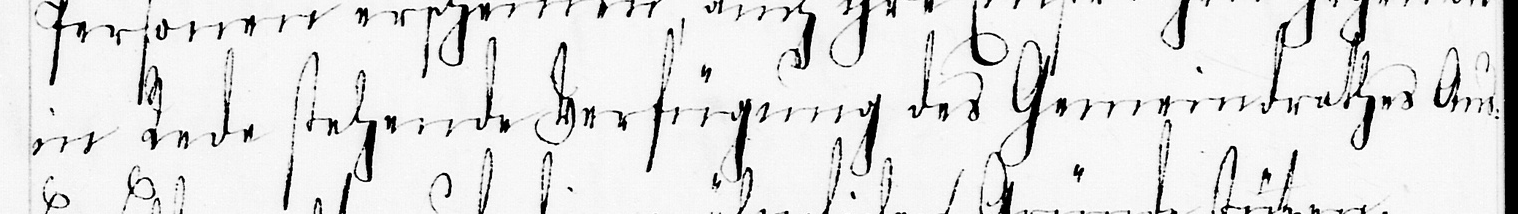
in Rede stehende Verfügung des Gemeindrathes Au¬
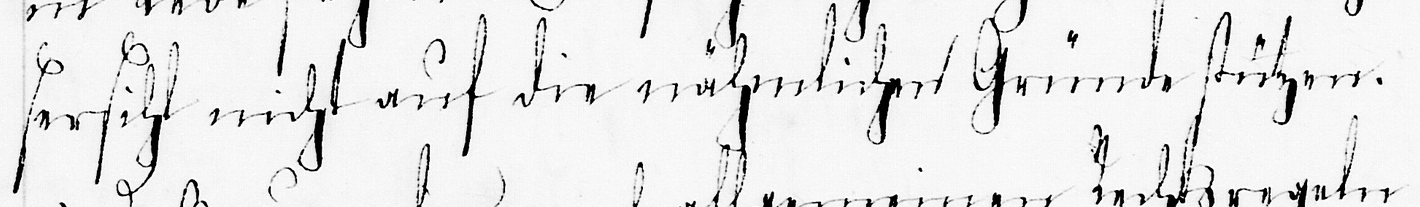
ßersihl nicht auf die nähmlichen Gründe stützen.
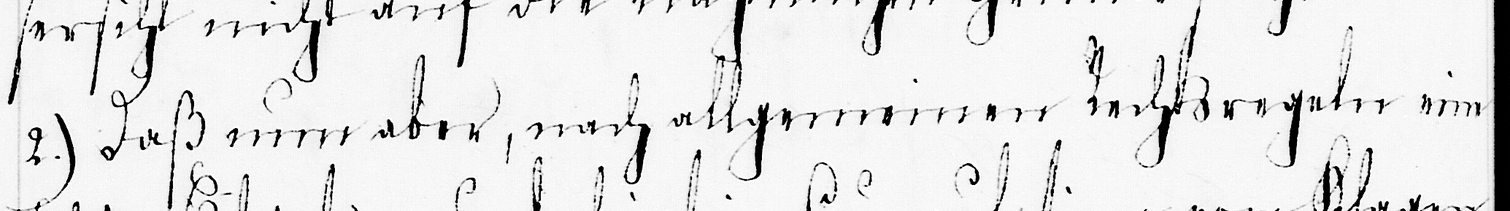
2.) Daß nun aber, nach allgemeinen Rechtsregeln eine
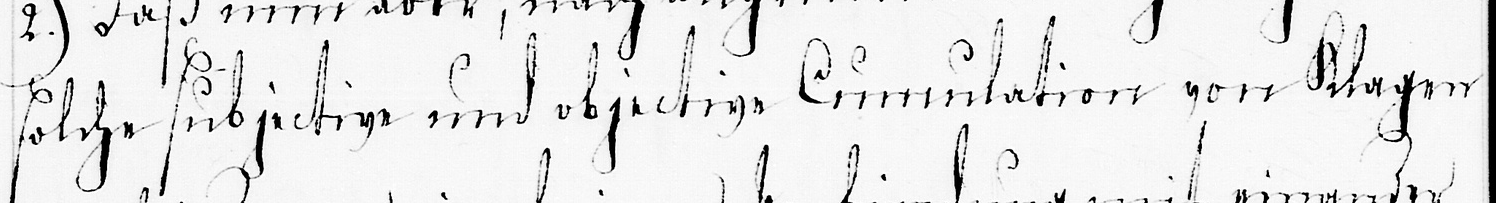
solche subjective und objective Cumulation von Klagen
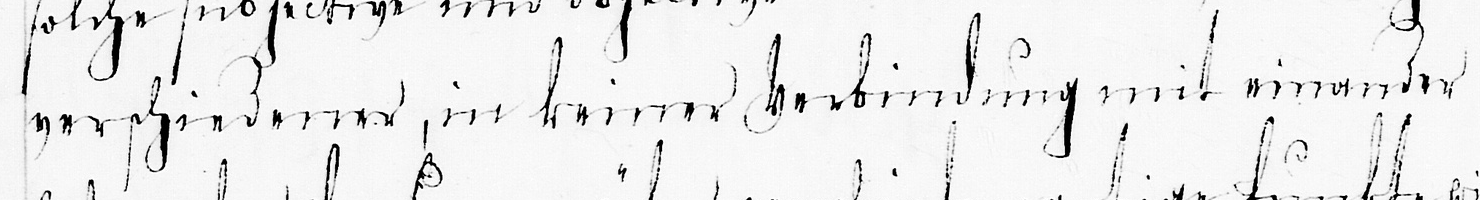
verschiedener, in keiner Verbindung mit einander
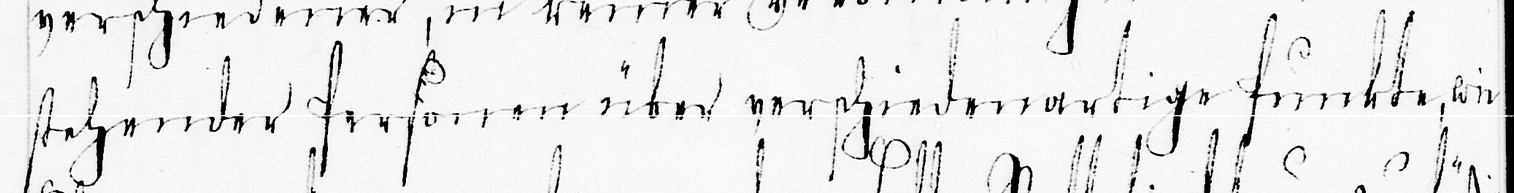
stehender Personen über verschiedenartige Punkte, wie
